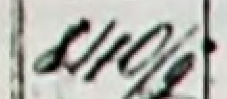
840/g
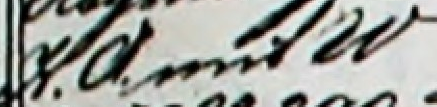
N.A. mit 20
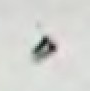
„
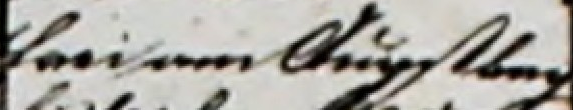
Frei am Augstbach
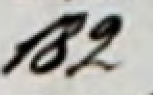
182
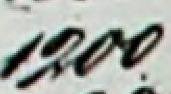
1200
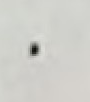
„
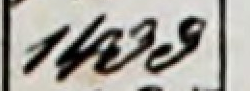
1433
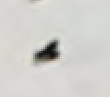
„
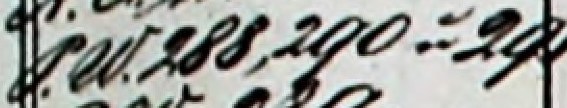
P.W. 288, 290 u 291
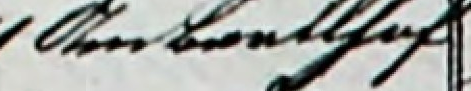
Anbontthof
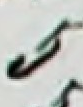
5
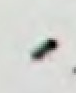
„
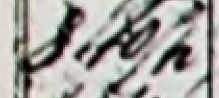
840/h
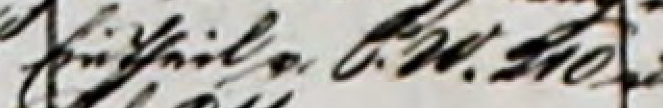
Ein Theil v. P.W 210
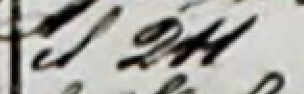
et 211
